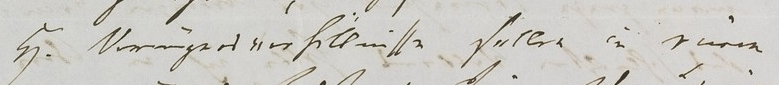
H. Vermögensverhältnisse sollen in einem
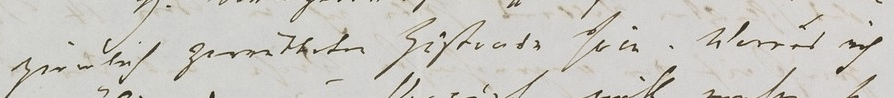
ziemlich zerrütteten Zustande sein. Woraus ich
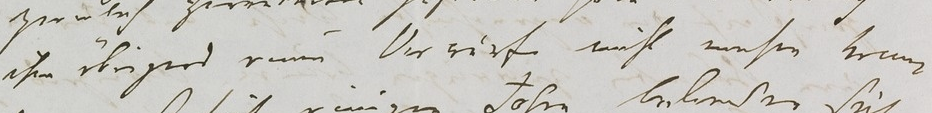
ihm übrigens einen Vorwurf nicht machen kann,
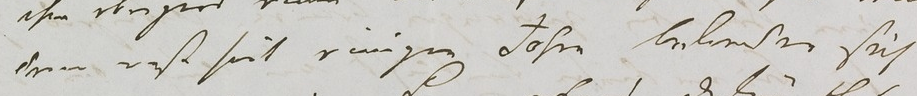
denn erst seit einigen Jahre b...nd er sich
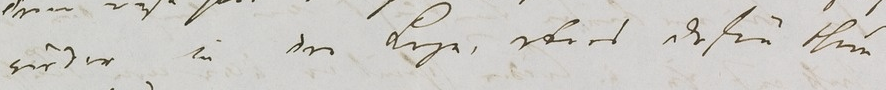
wieder in der Lage, etwas dafür thun
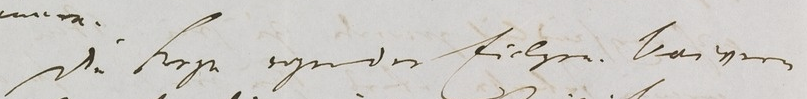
Die Frage wegen der Eidgen. Univer-
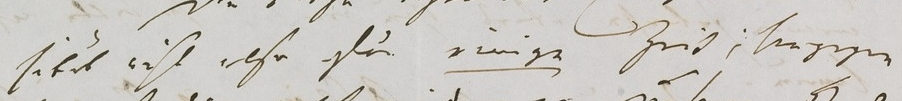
sität ruht also für einige Zeit; hingegen
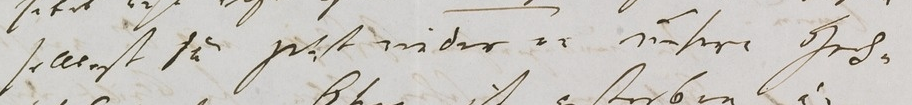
solltest Du jetzt wieder an unsere Hoch-
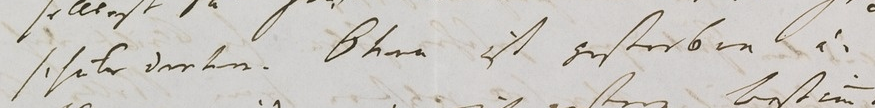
schule denken. Oken ist gestorben u.
